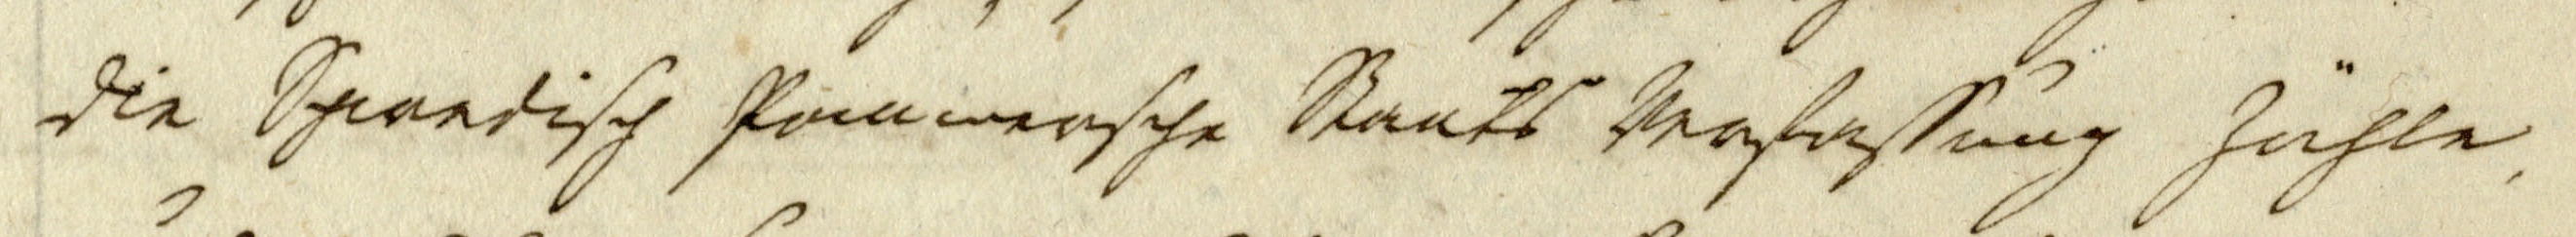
die Schwedisch Pommersche Staatsverfassung zähle,
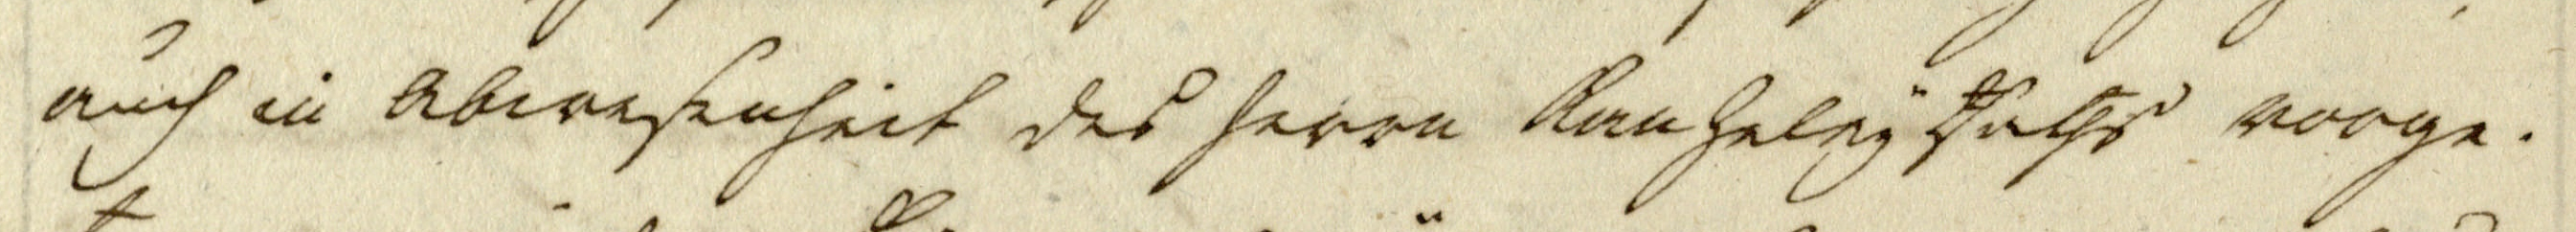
auch in Abwesenheit des herrn Kanzleÿ Raths vorge¬
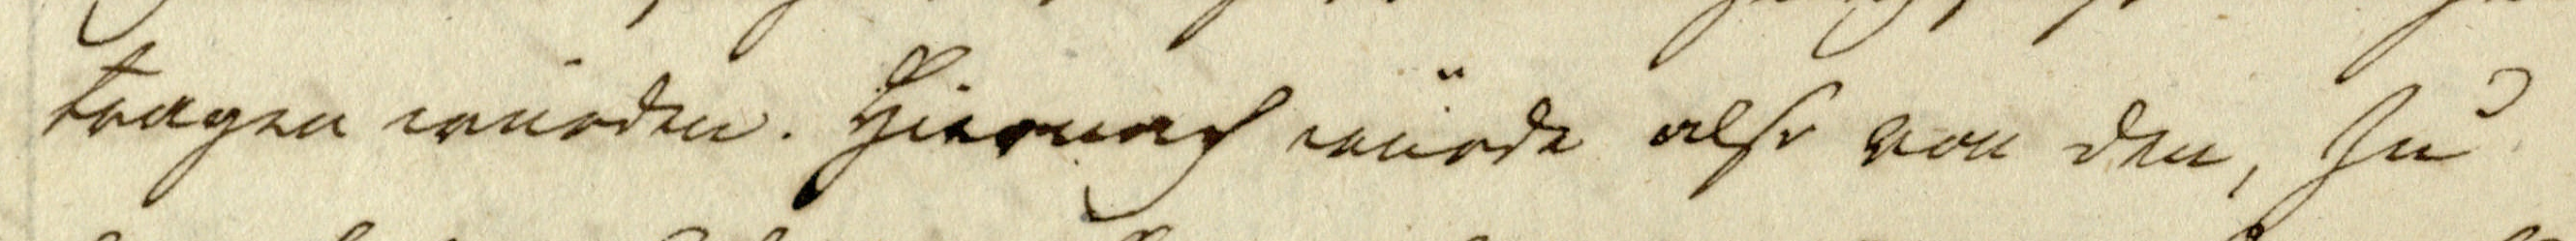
tragen würden. Hiernach würde also von den, zu
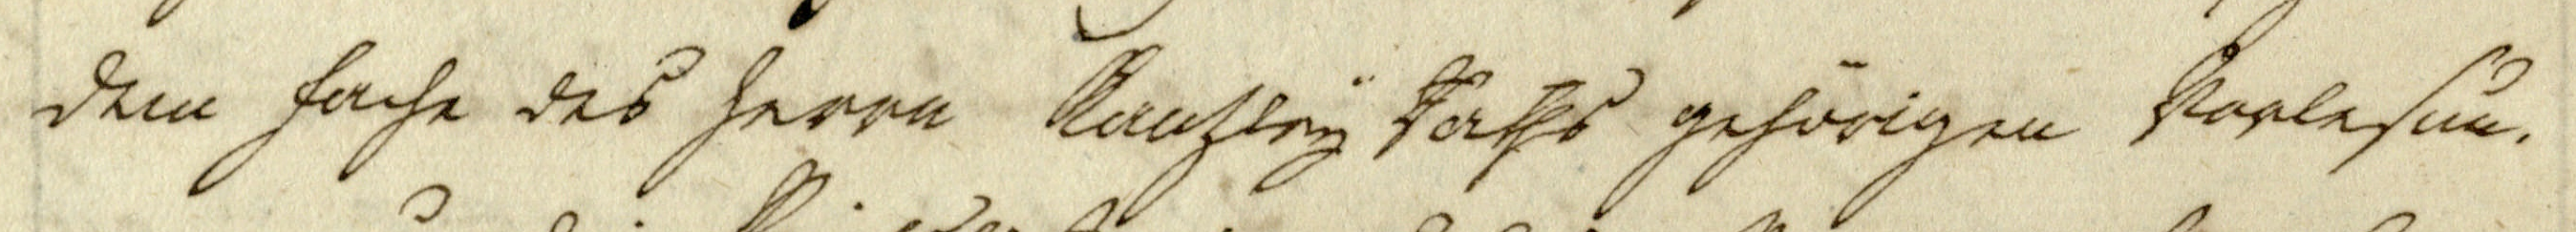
dem Fache des herrn Kanzleÿ Raths gehörigen Vorlesun¬
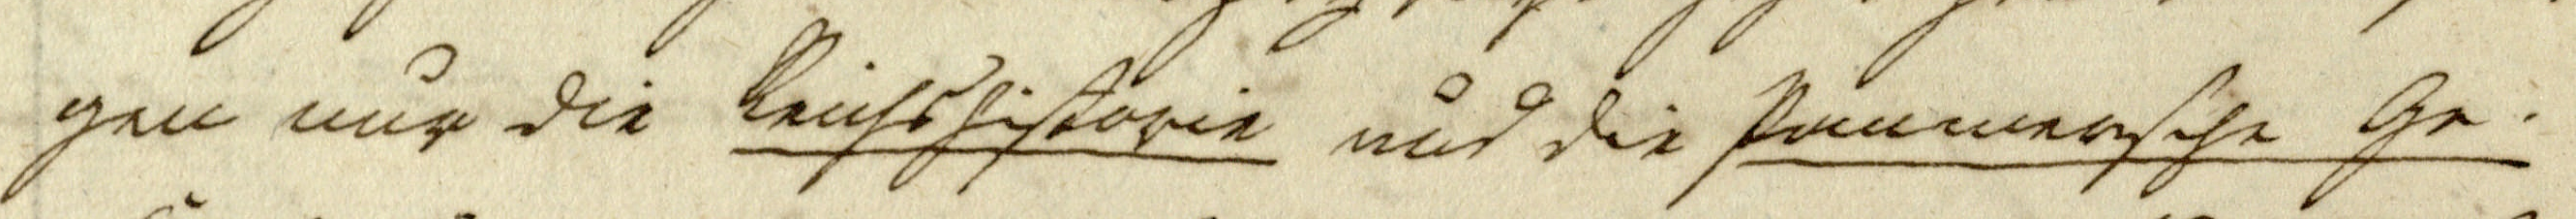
gen nur die Reichshistorie und die Pommersche Ge¬
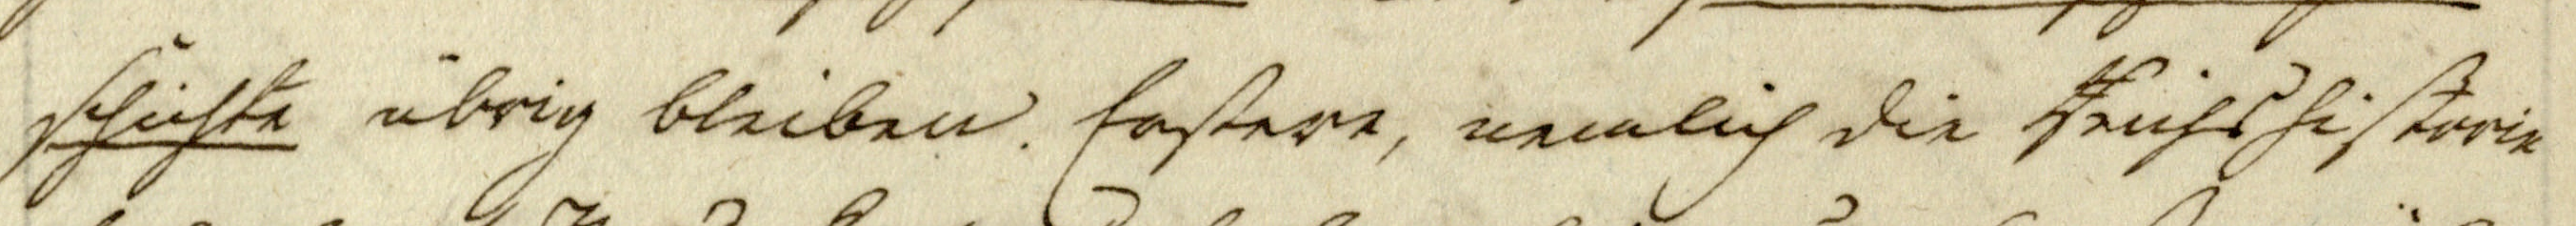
schichte übrig bleiben. Erstere, nemlich die Reichshistorie
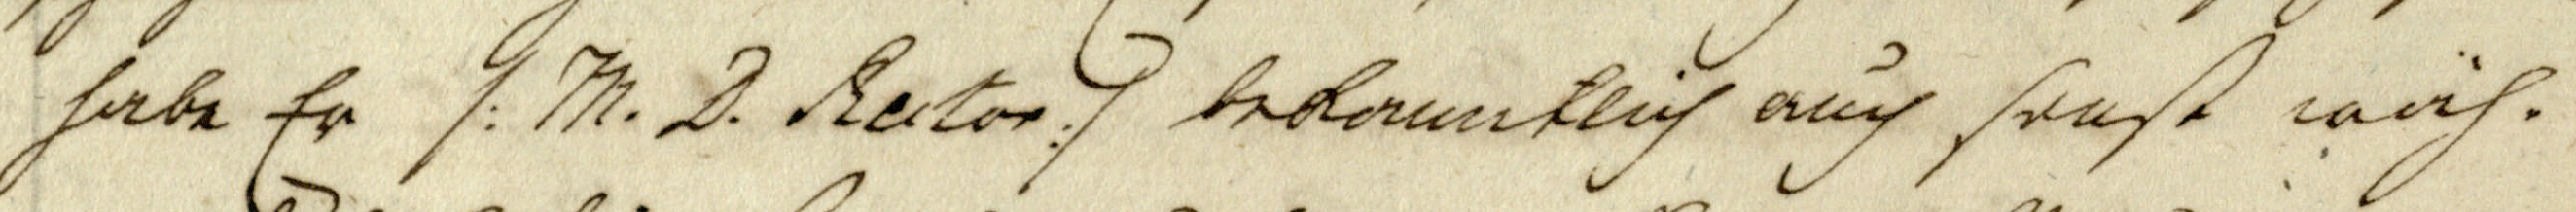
habe Er / M. D. Rector / bekanntlich auch sonst wäh¬
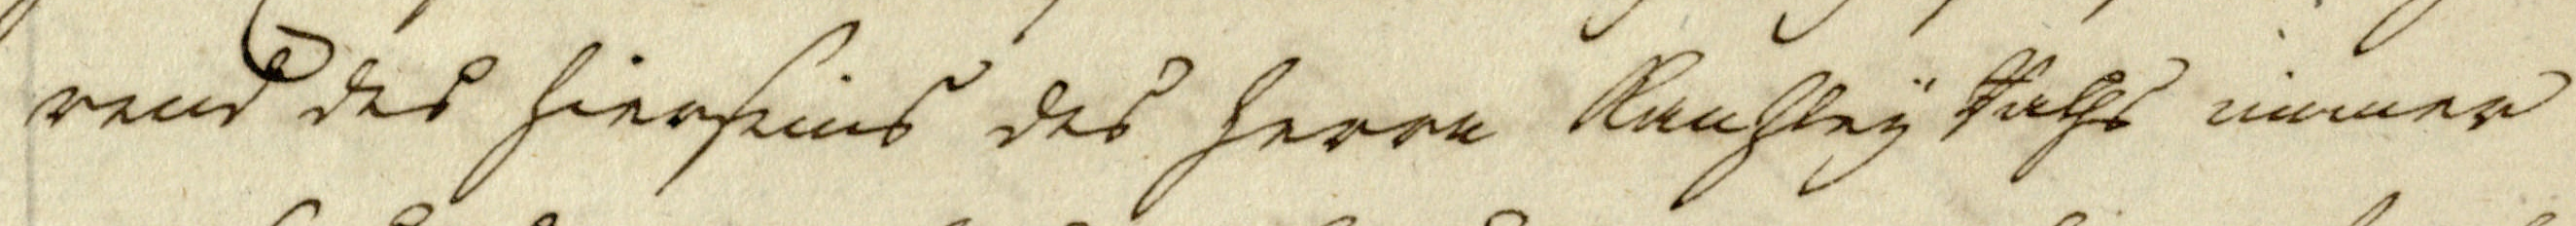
rend des hierseins des herrn Kanzleÿ Raths immer
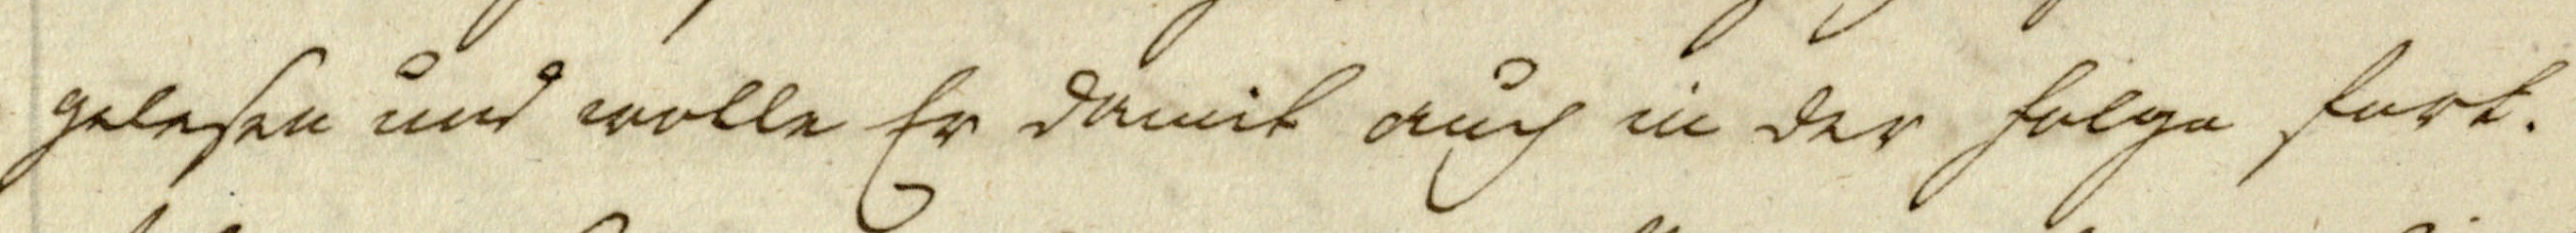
gelesen und wolle Er damit auch in der Folge fort¬
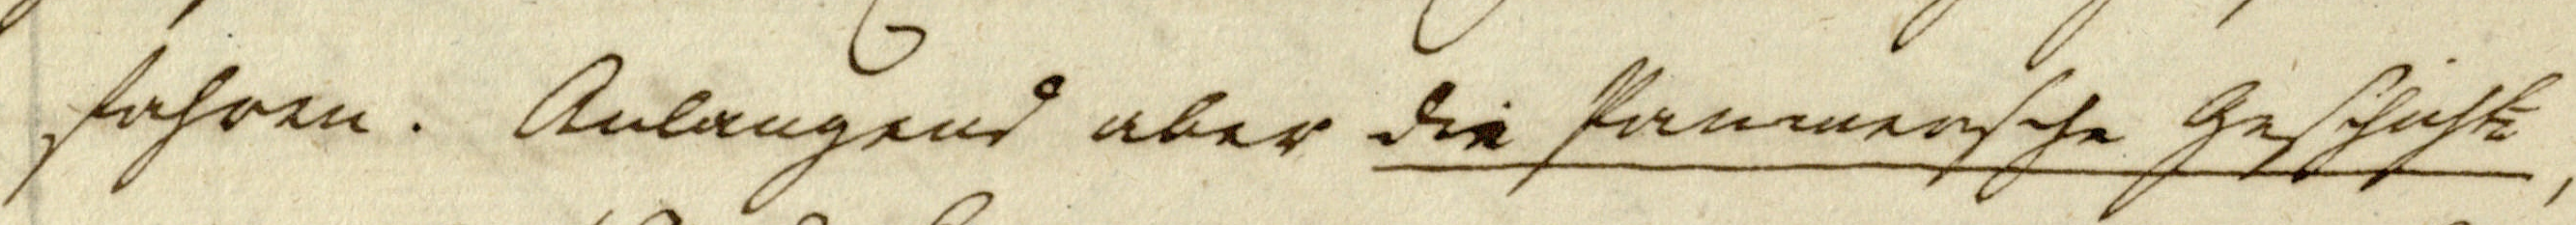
fahren. Anlangend aber die Pommersche Geschichte,
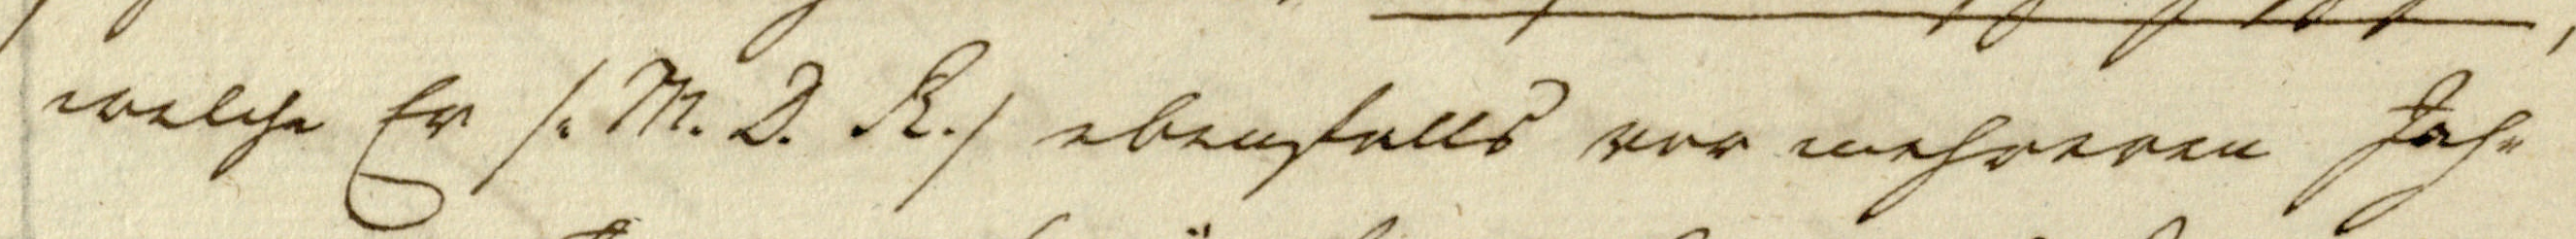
welche Er / M. D. R. / ebenfalls vor mehreren Jah¬
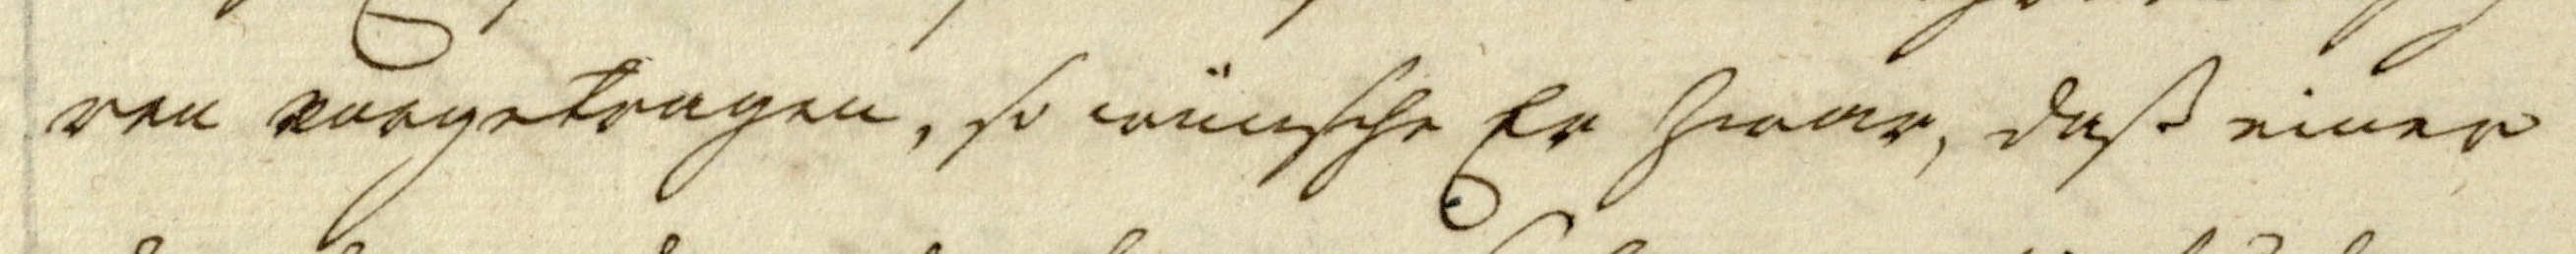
ren vorgetragen, so wünsche Er zwar, daß einer
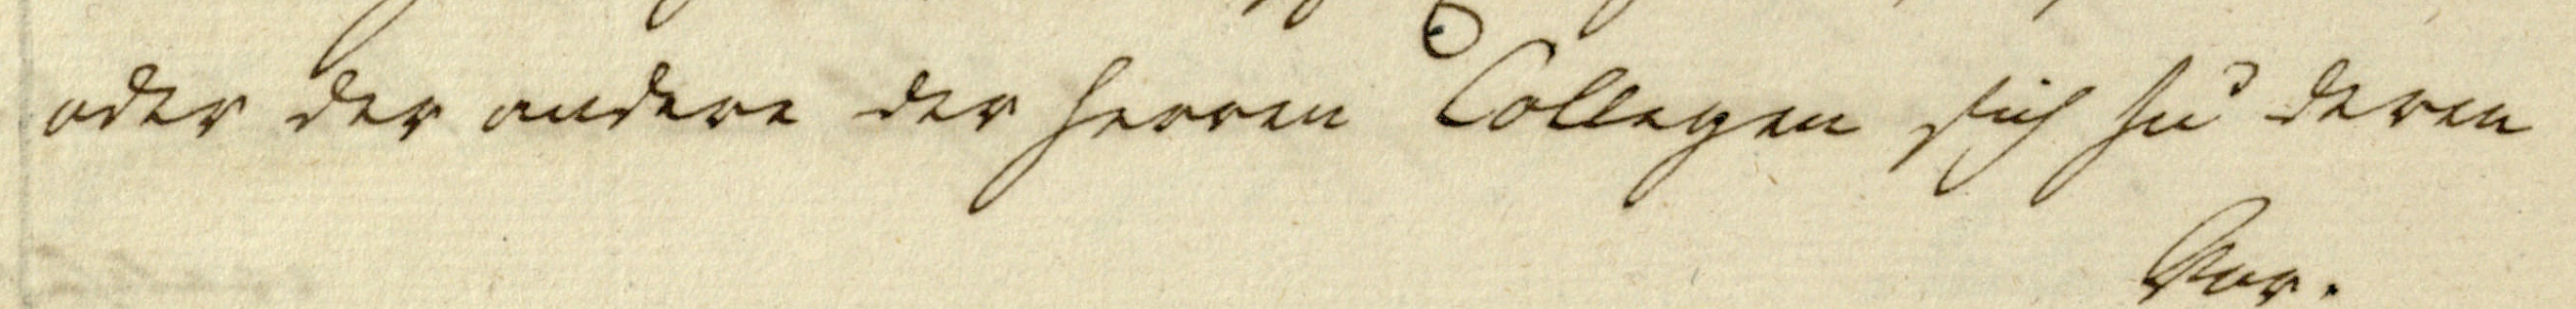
oder der andere der herren Collegen sich deren
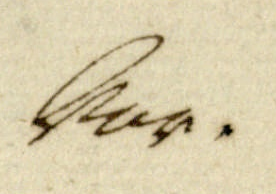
Vor.
